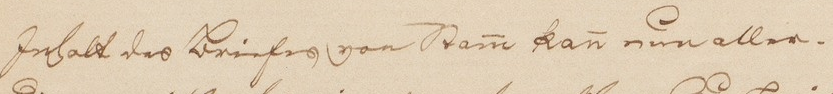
Inhalt des Briefes von Stamm kann nun aller-
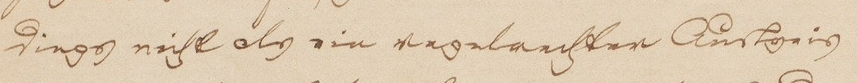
dings nicht als ein regelrechter Ausweis
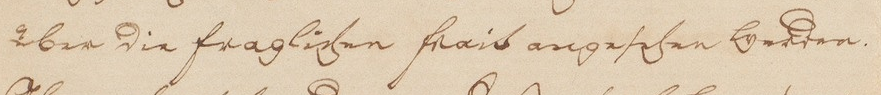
über die fraglichen frais angesehen werden.
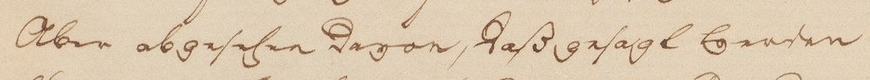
Aber abgesehen davon, daß gesagt werden
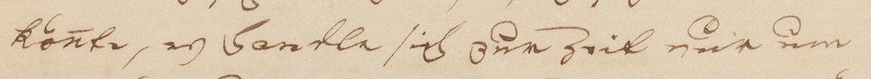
könnte, es handle sich zur Zeit nur um
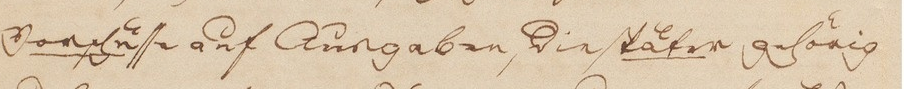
Vorschüsse auf Ausgaben, die später gehörig
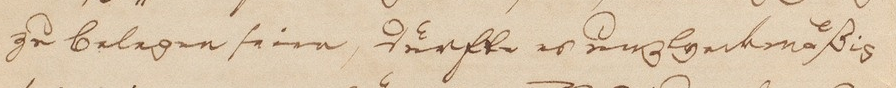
zu belegen seien, düfte es unzweckmäßig
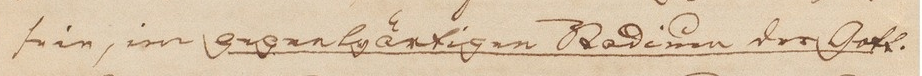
sein, im gegenwärtigen Stadium der Gott-
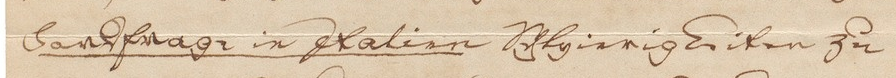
hardfrage in Italien Schwierigkeiten zu
